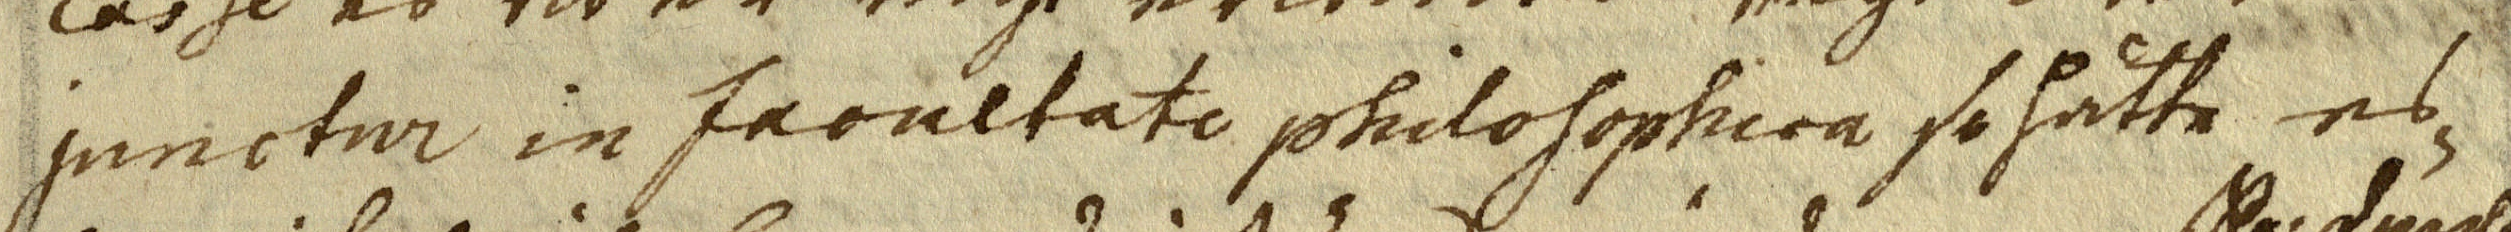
junctur in Facultate philosophica so hätte es
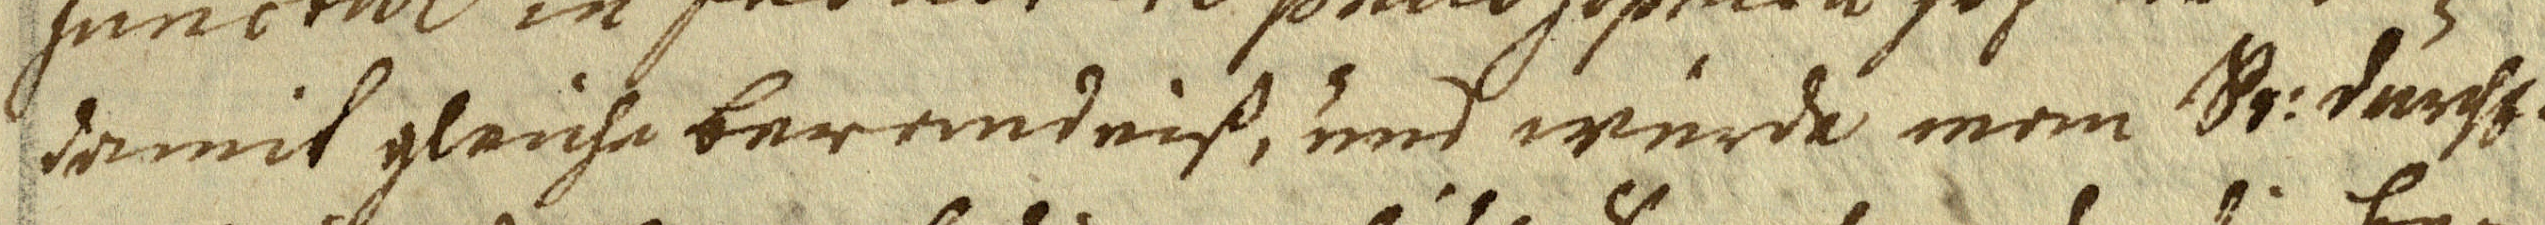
damit gleiche Bewandniß, und würde man Sr Durchl.
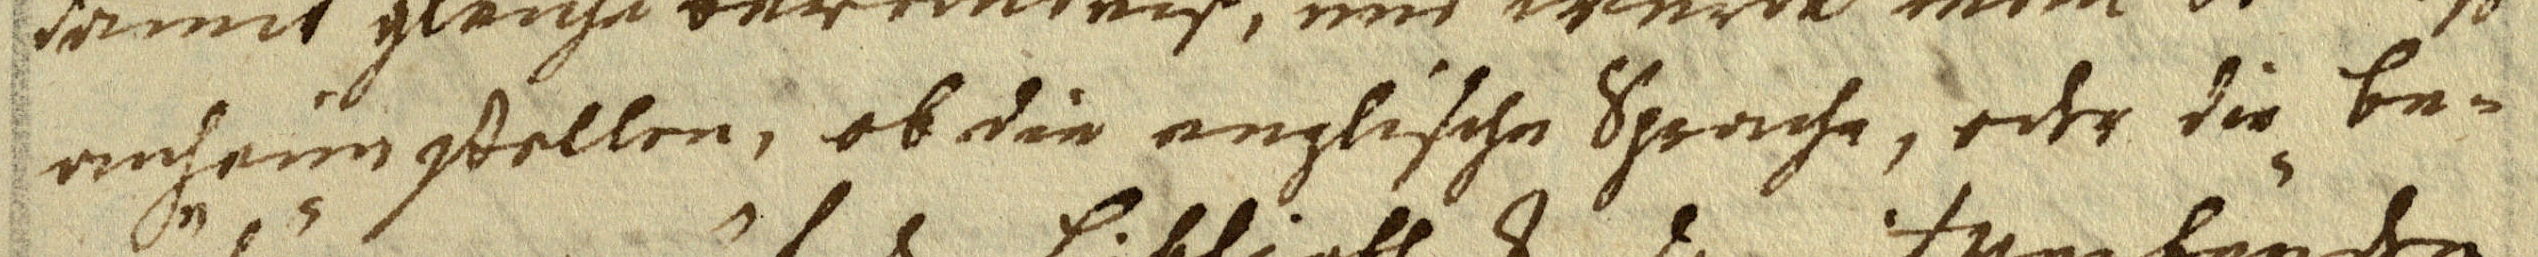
anheim stellen, ob die englische Sprache, oder die Be¬
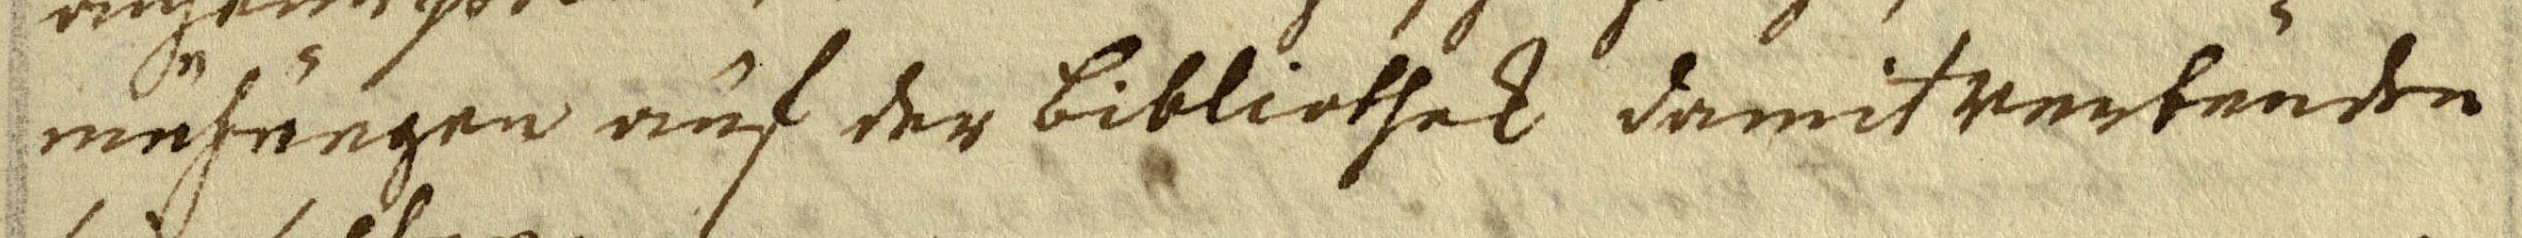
mühungen auf der Bibliothek damit verbunden
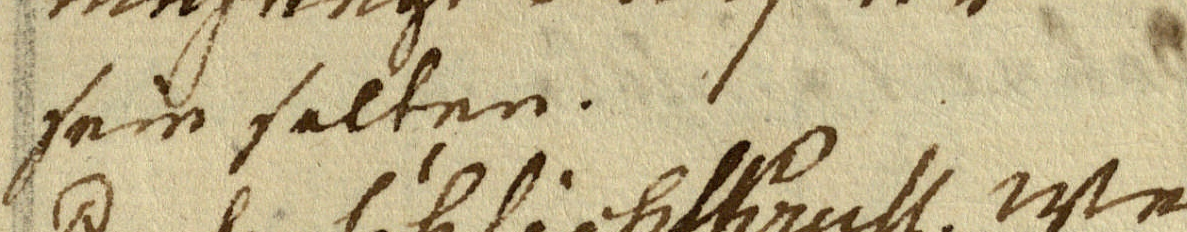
sein solten.
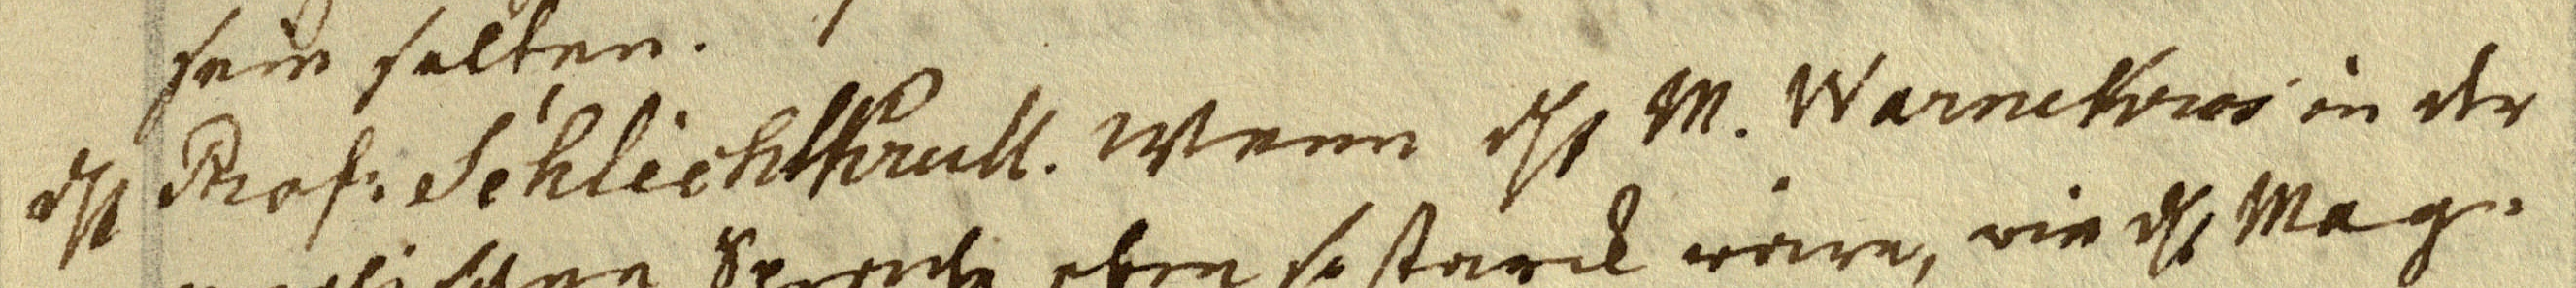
dh Prof. Schlichtkrull. wenn dh M. Warnekros in der
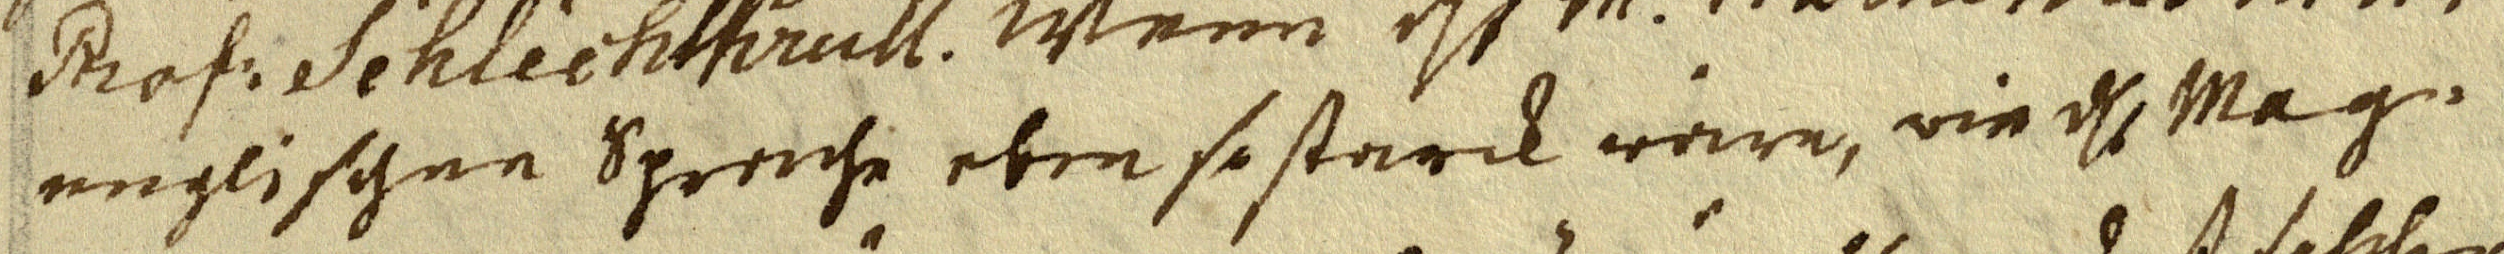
englischen Sprache eben so starck wäre, wie dh Mag.
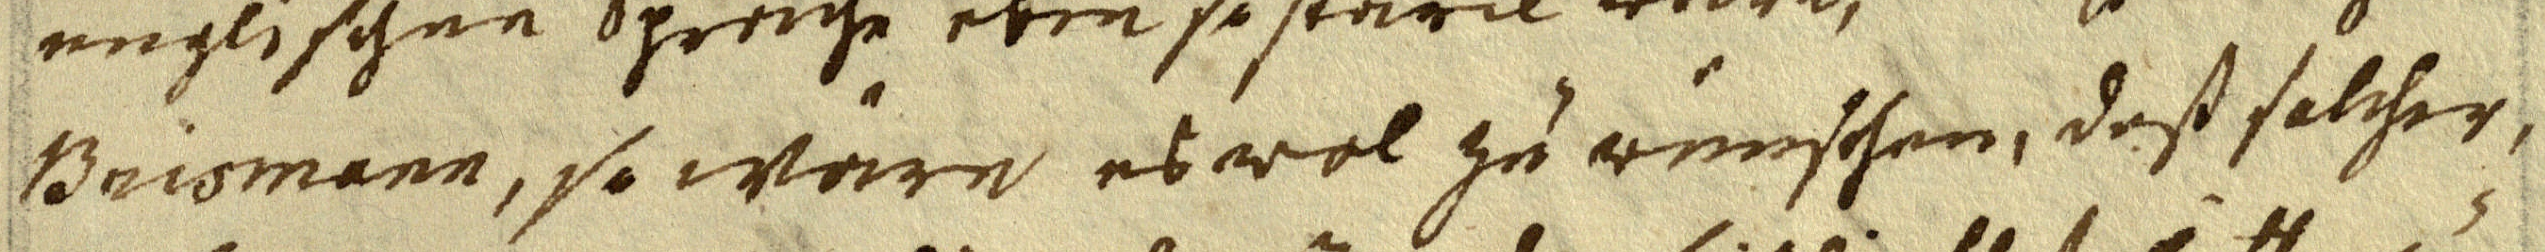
Brismann, so wäre es wol zu wünschen, daß solcher,
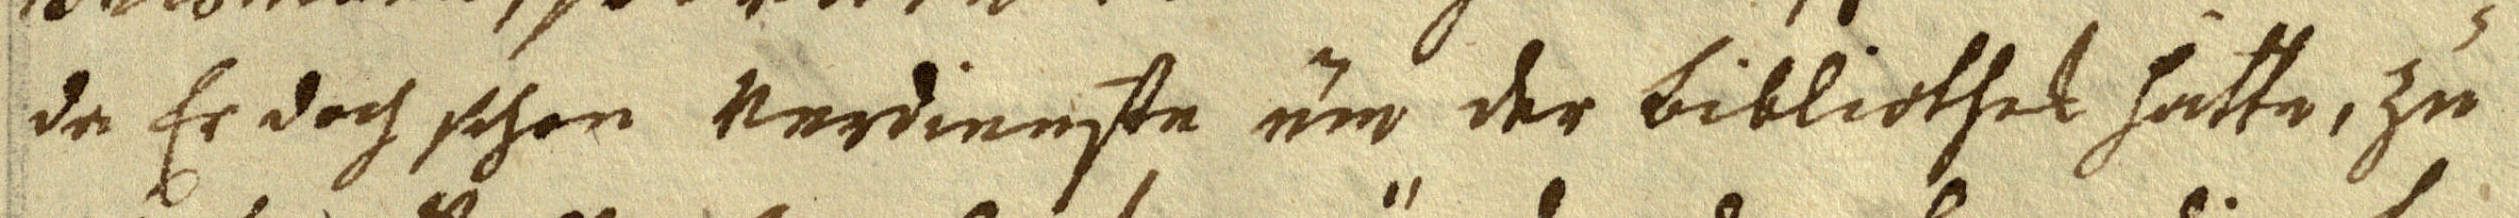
da Er doch schon Verdienste um der Bibliothek hätte, zu
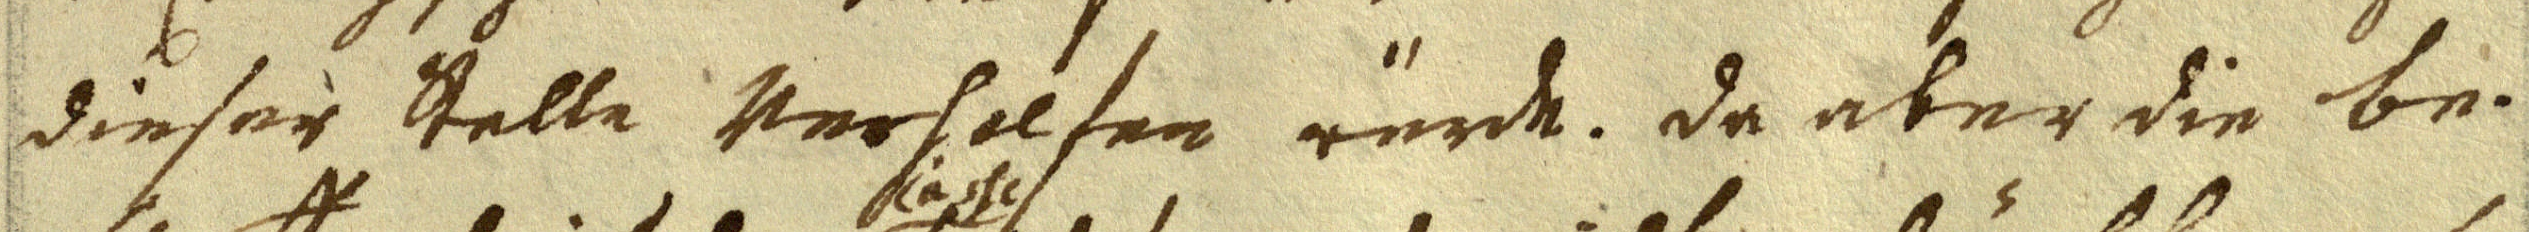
dieser Stelle verholfen würde. Da aber die be¬
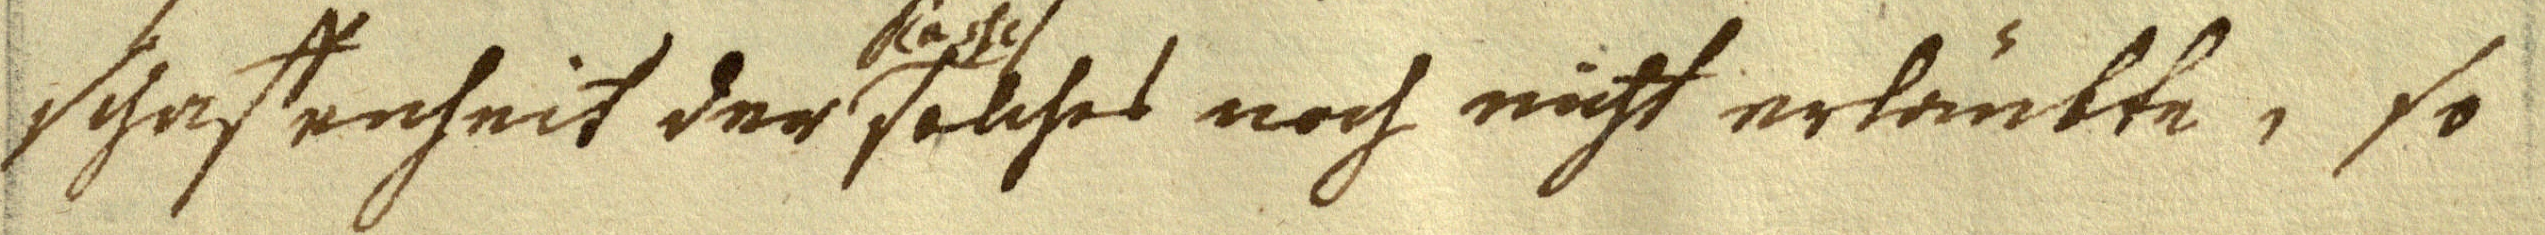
schaffenheit der Cassesolches noch nicht erlaubte, so
